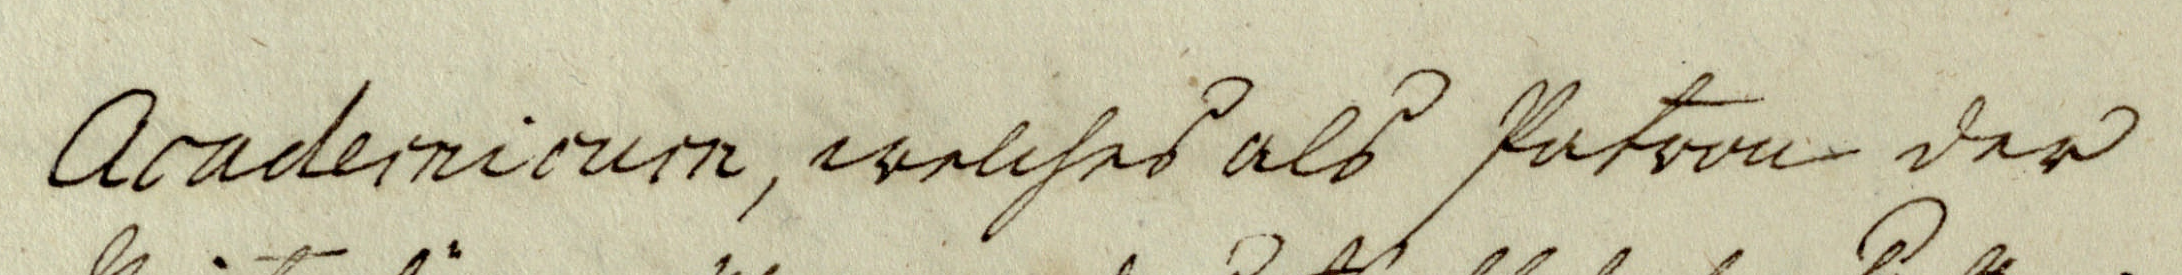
Academicum, welches als Patron der
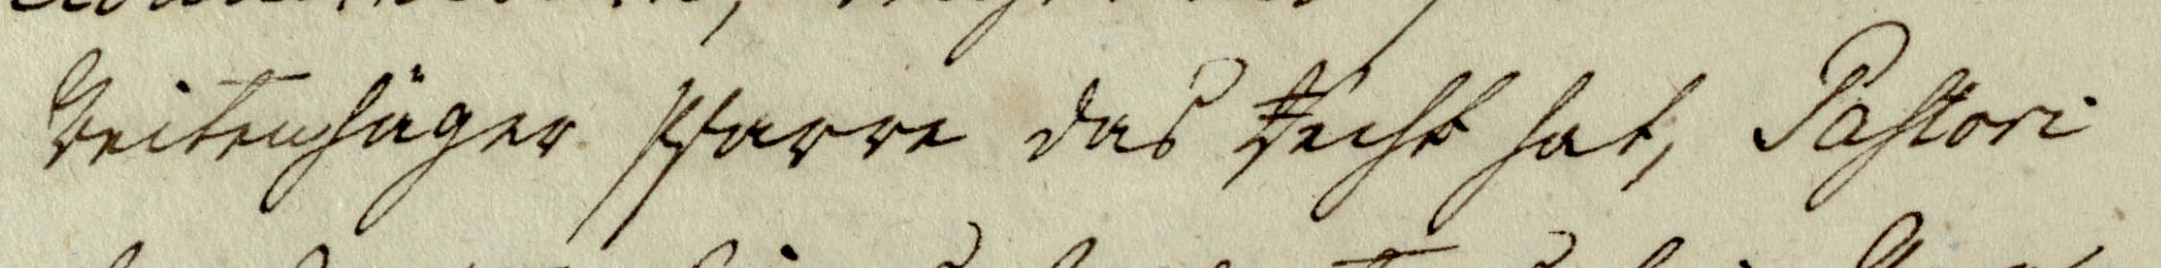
Weitenhäger Pfarre das Recht hat, Pastori
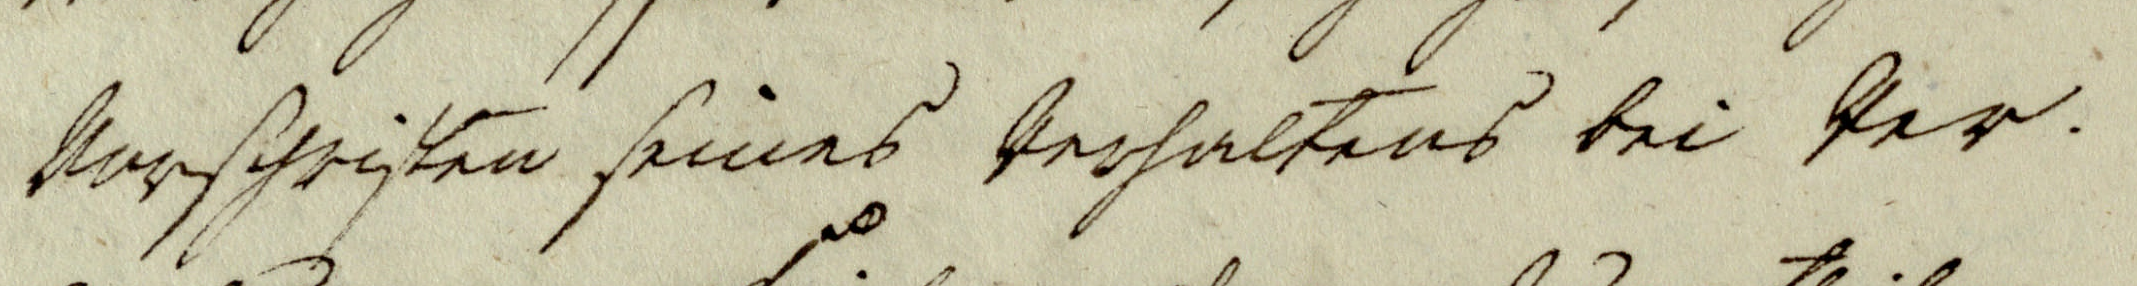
Vorschriften seines Verhaltens bei Ver¬
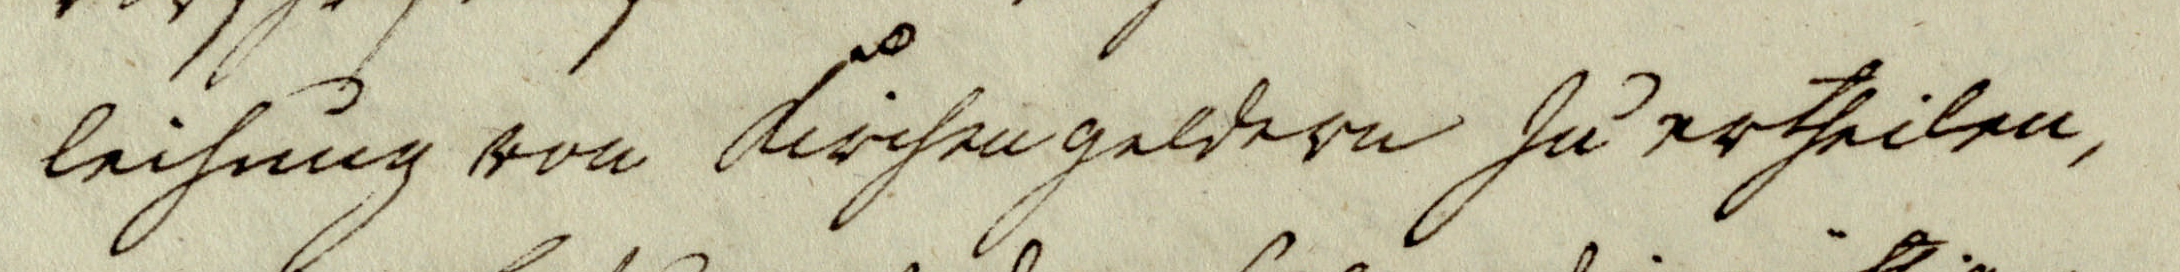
leihung von Kirchengeldern zu ertheilen,
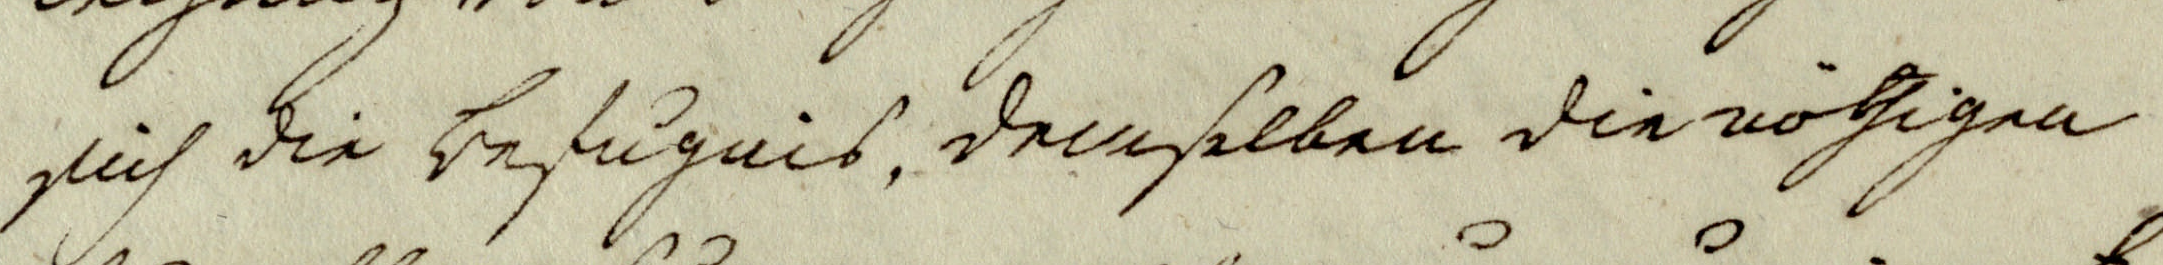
sich die Befugnis, demselben die nöthigen
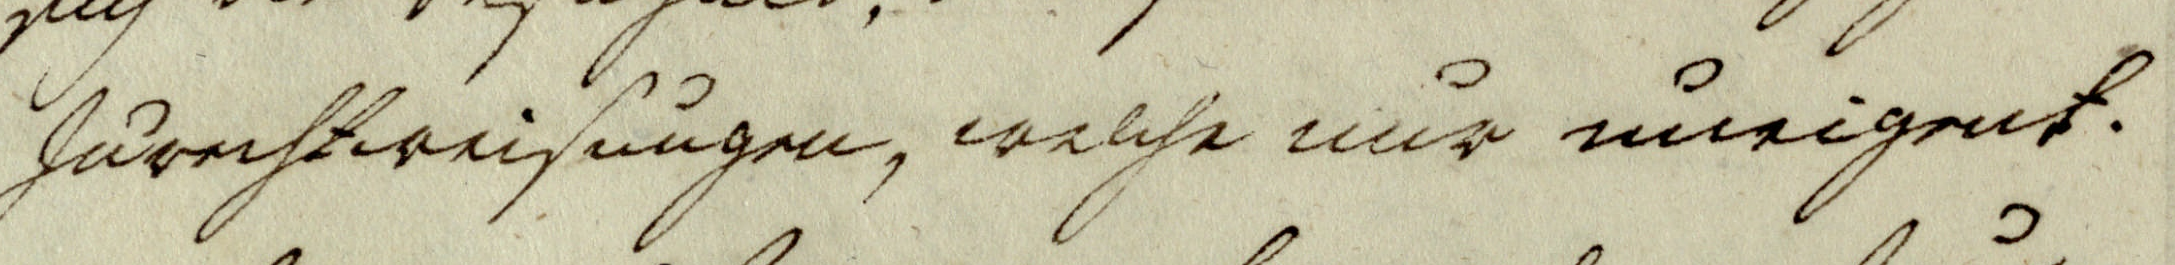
Zurechtweisungen, welche nur uneigent¬
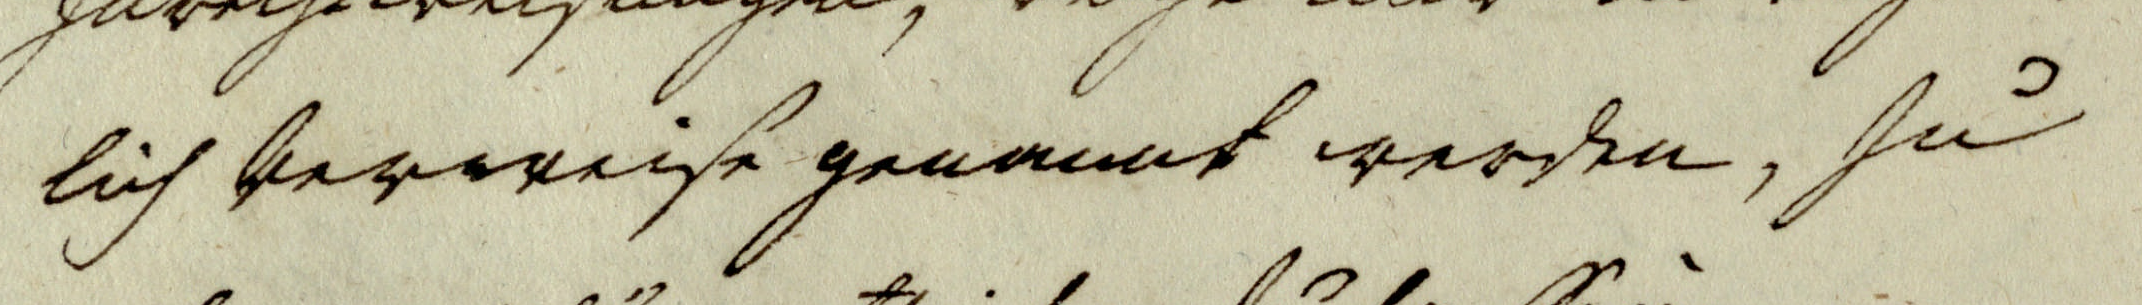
lich Verweise genannt werden, zu
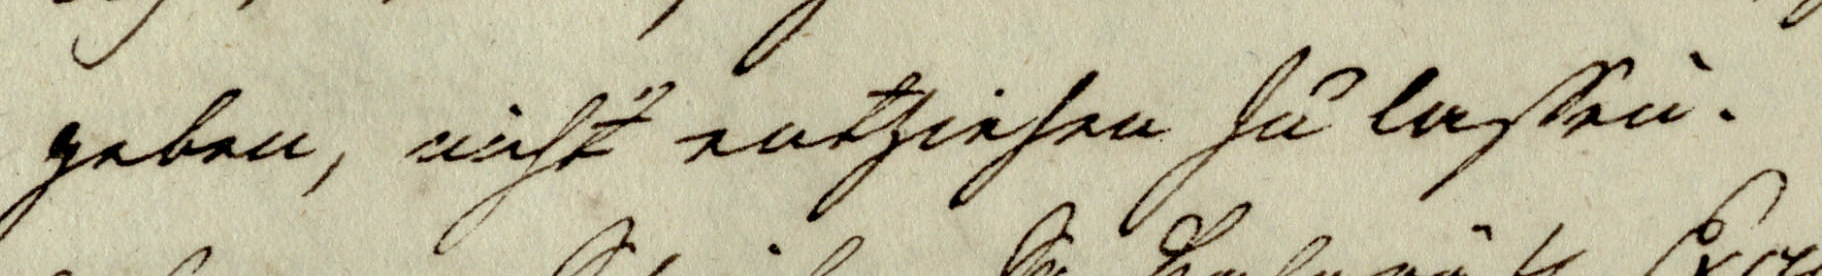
geben, nicht entziehen zu lassen.
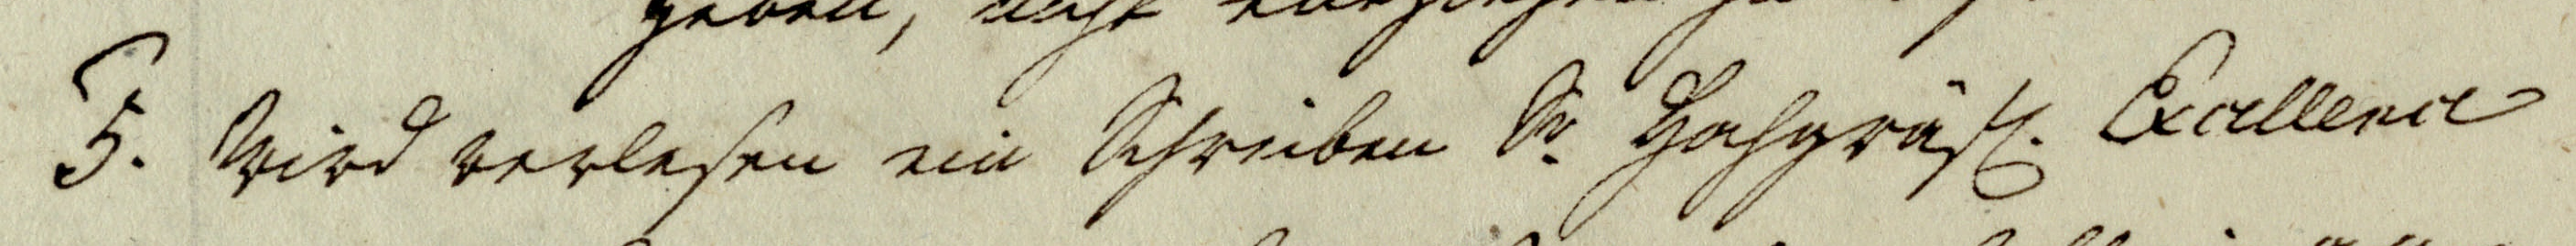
5. Wird verlesen ein Schreiben Sr Hochgräfl. Excellence
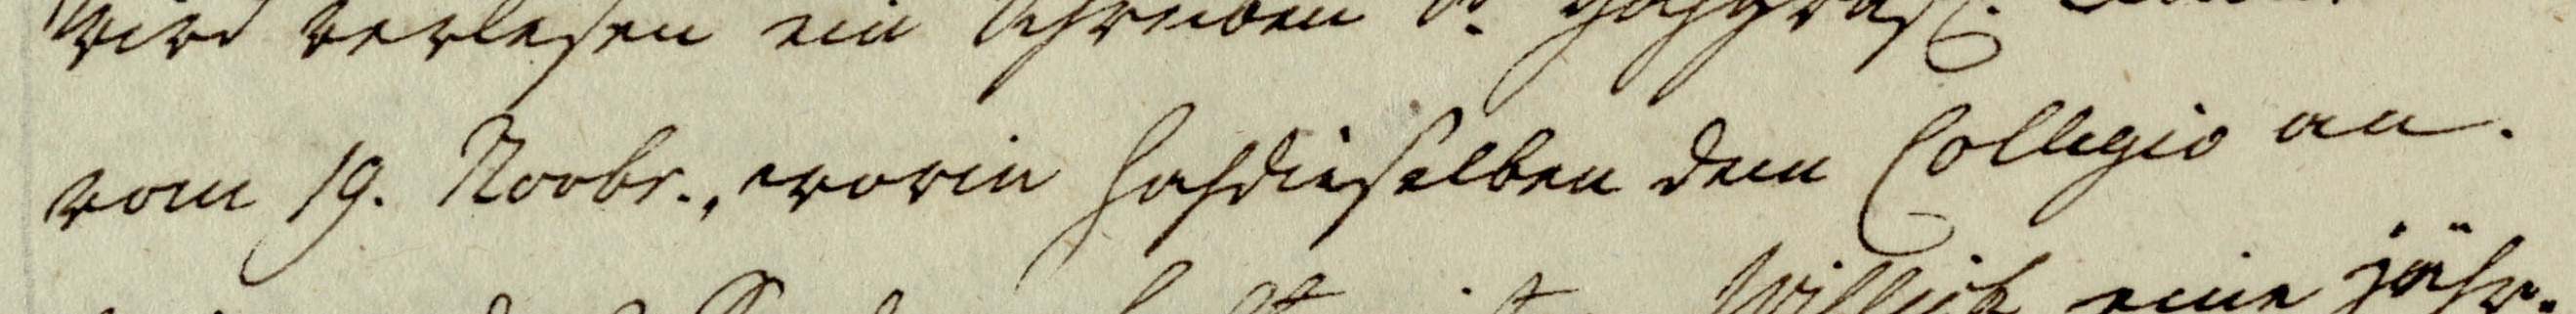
vom 19. Novbr., worin hochdieselben dem Collegio an¬
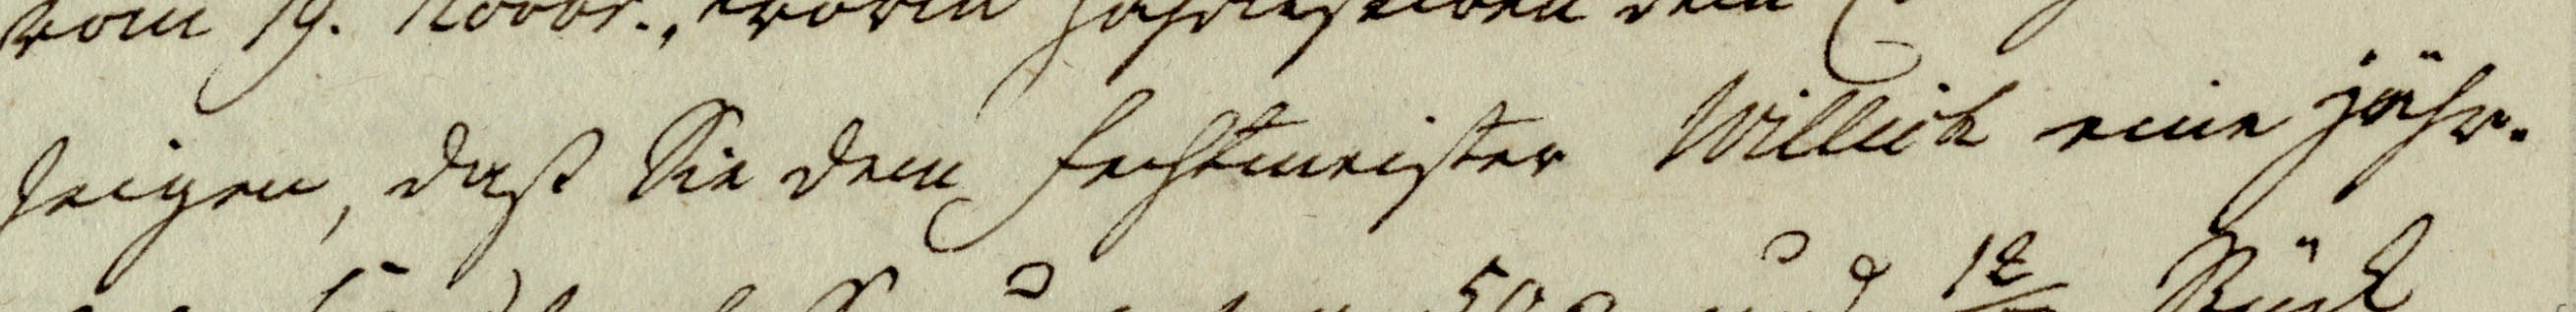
zeigen, daß Sie dem Fechtmeister Willich eine jähr¬
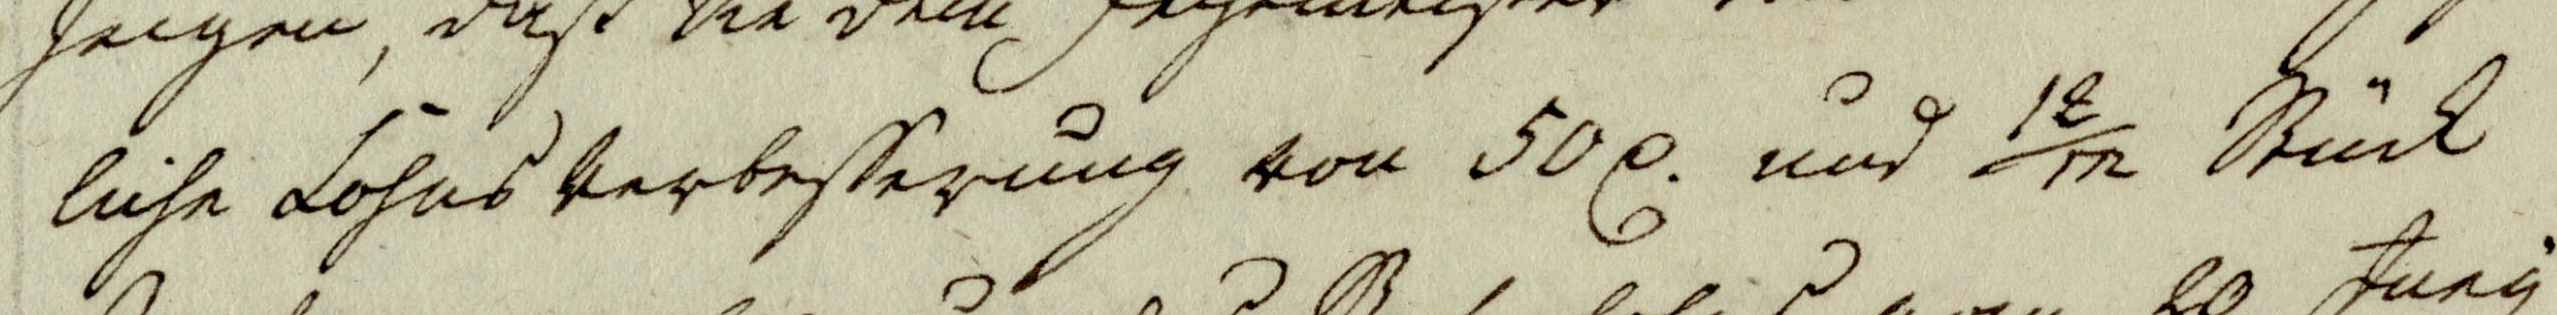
liche Lohns Verbesserung von 50 l. und 12 Stück
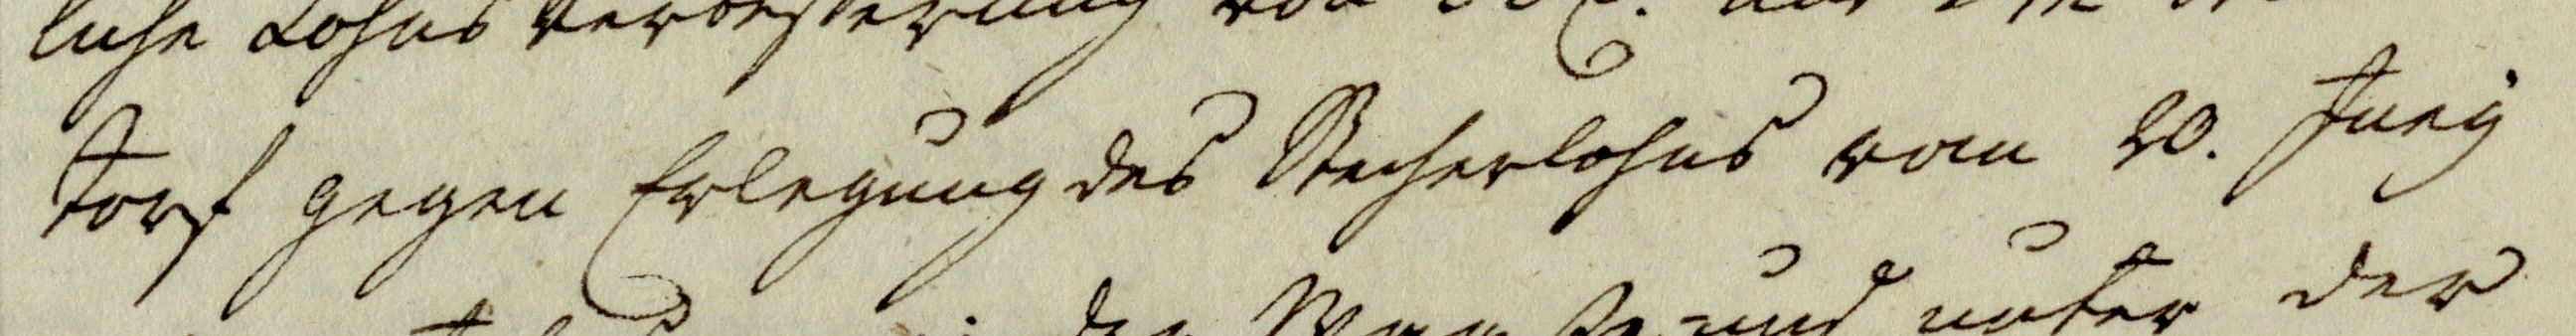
Torf gegen Erlegung des Stecherlohns vom 20. Juny
